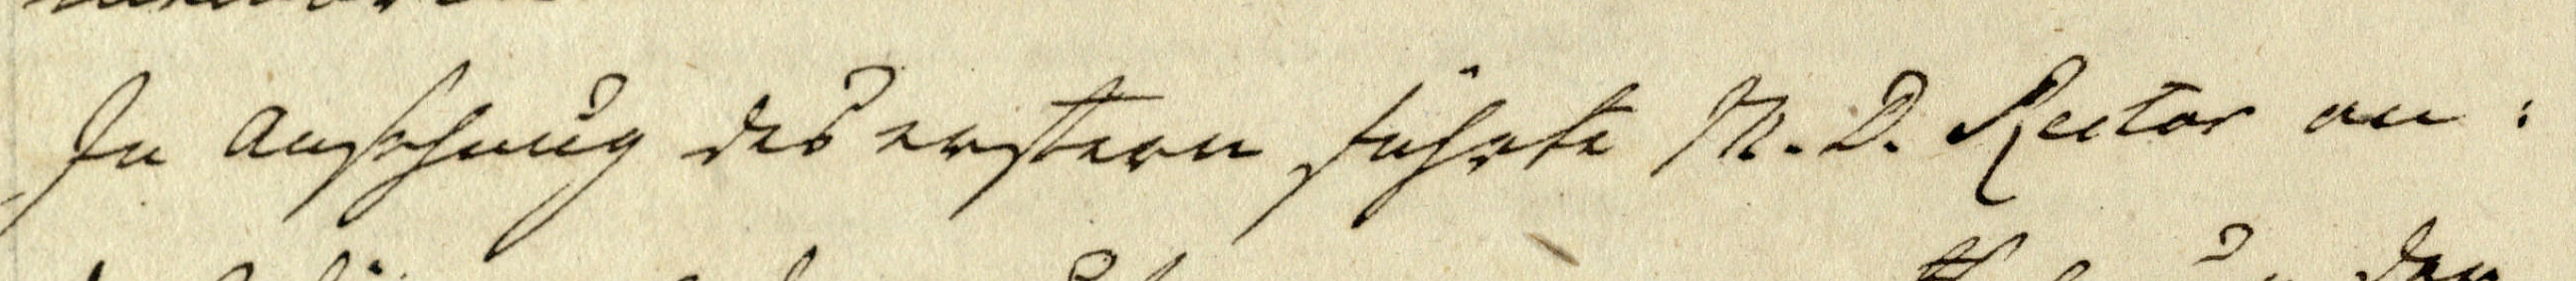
In Ansehung des erstern führte M. D. Rector an:
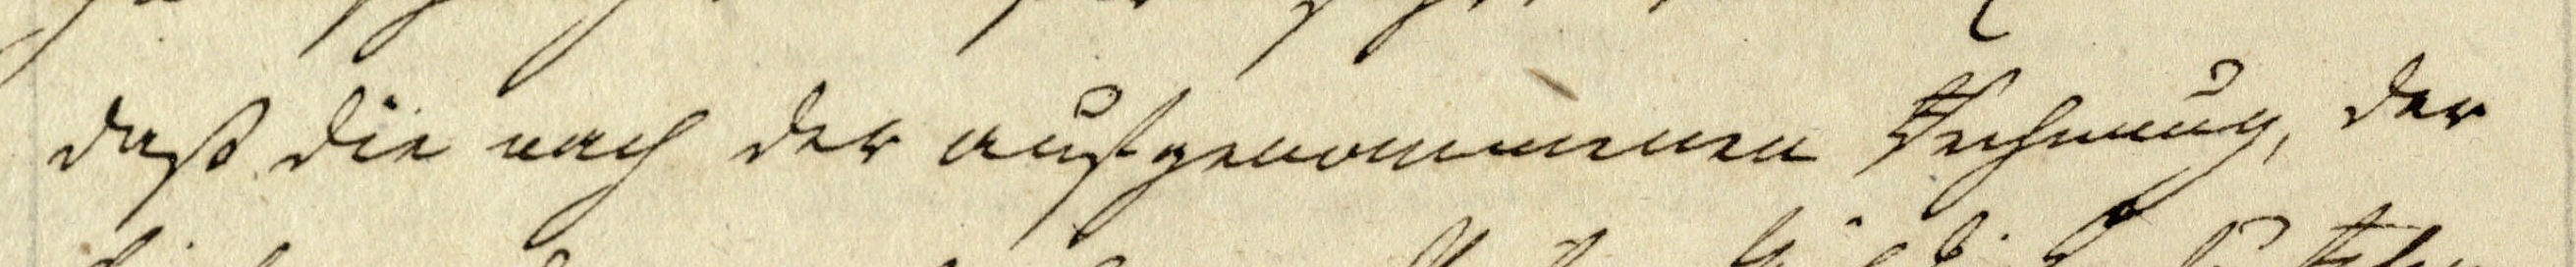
daß die nach der aufgenommenen Rechnung, der
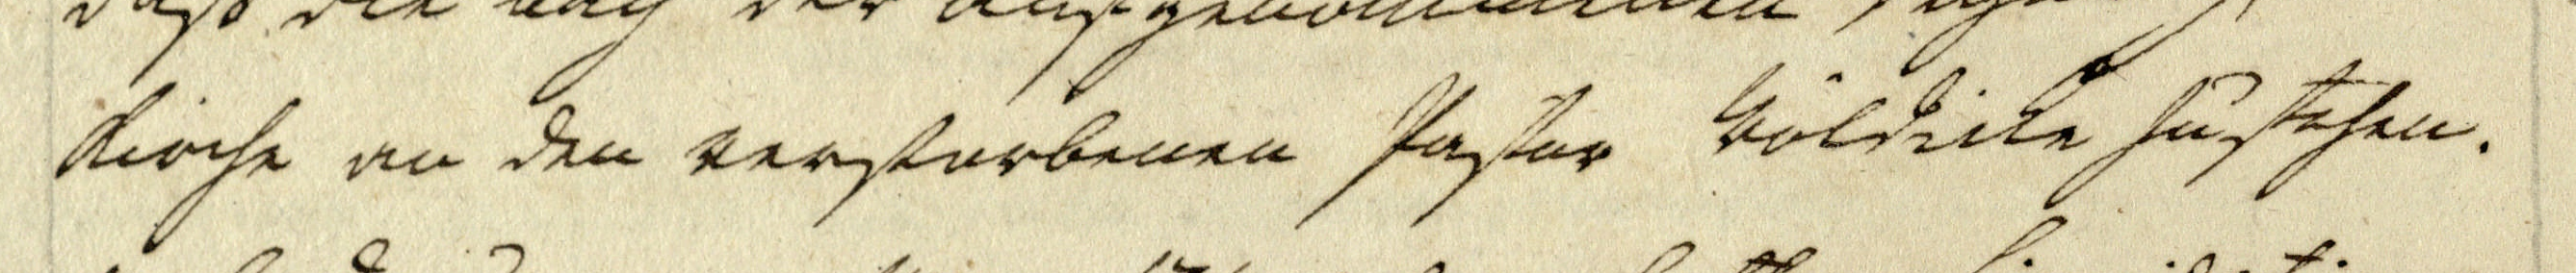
Kirche an den verstorbenen Pastor Wöldicke zustehen¬
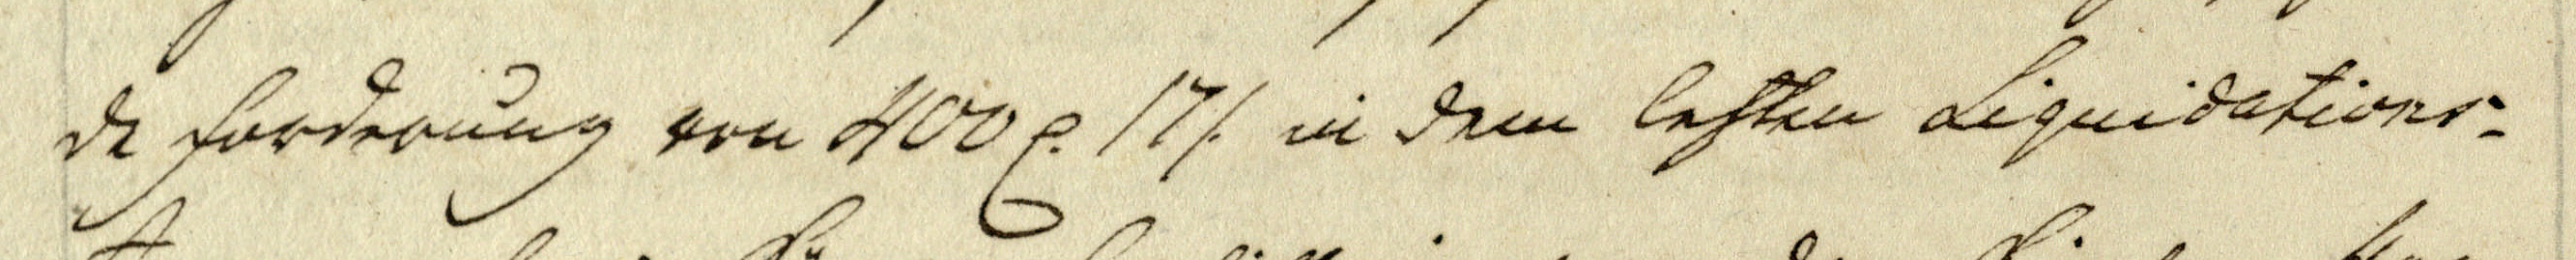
de Forderung von 400 l. 17 s. in dem letzten Liquidations¬
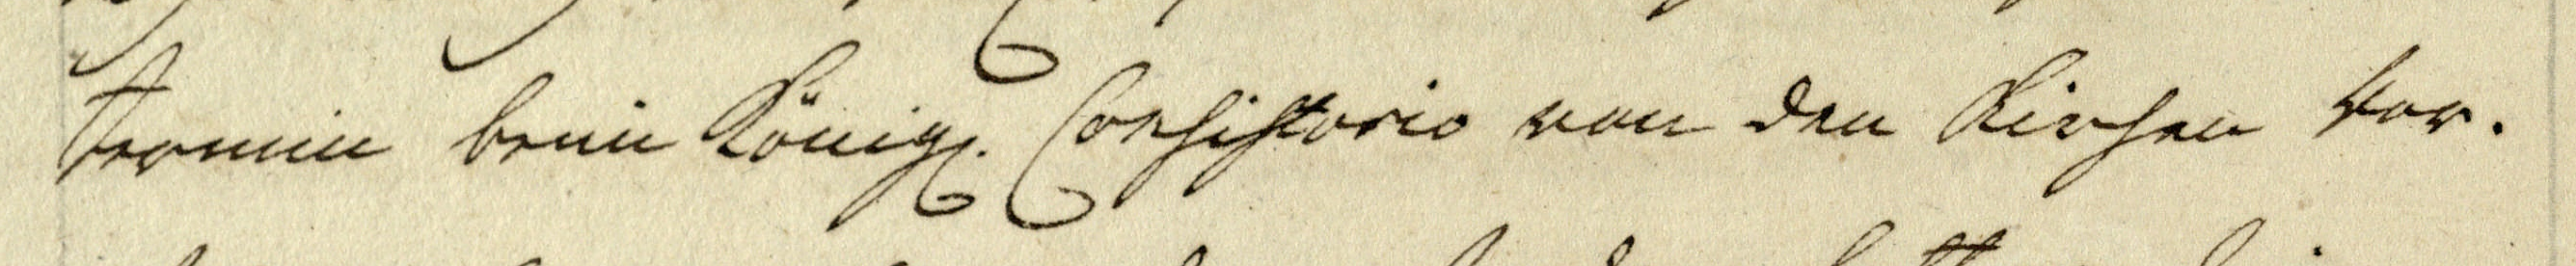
termin beim Königl. Consistorio von den Kirchen Vor¬
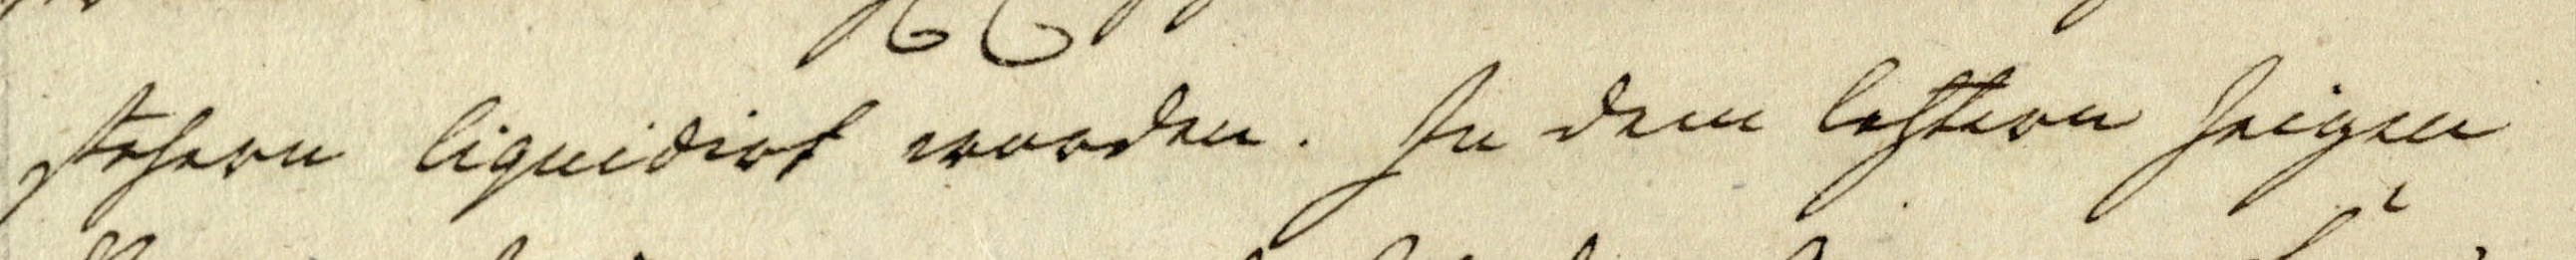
stehern liquidirt worden. In dem letztern zeigen
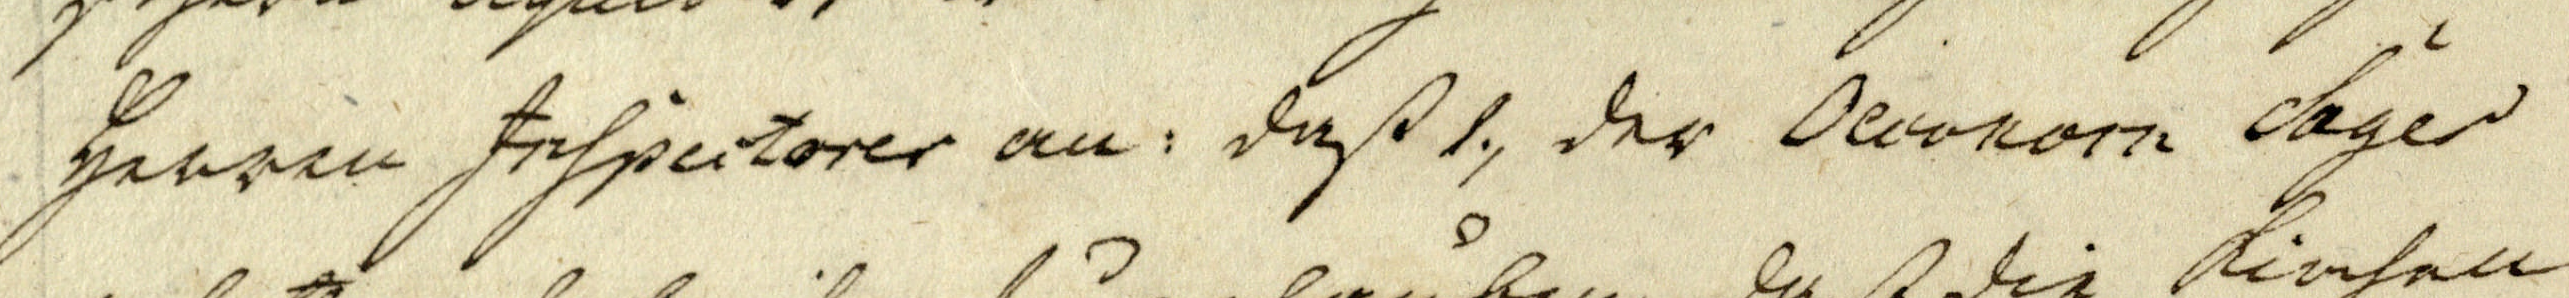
Herren Inspectores an: daß 1., der Oeconom Sager
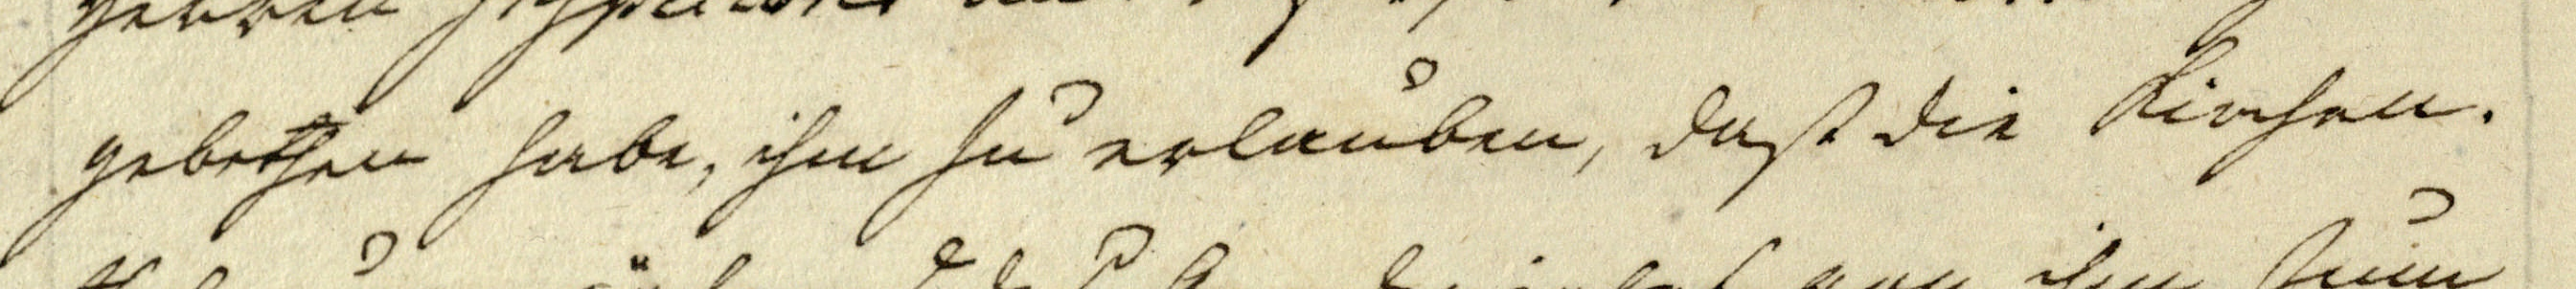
gebethen habe, ihm zu erlauben, daß die Kirchen¬
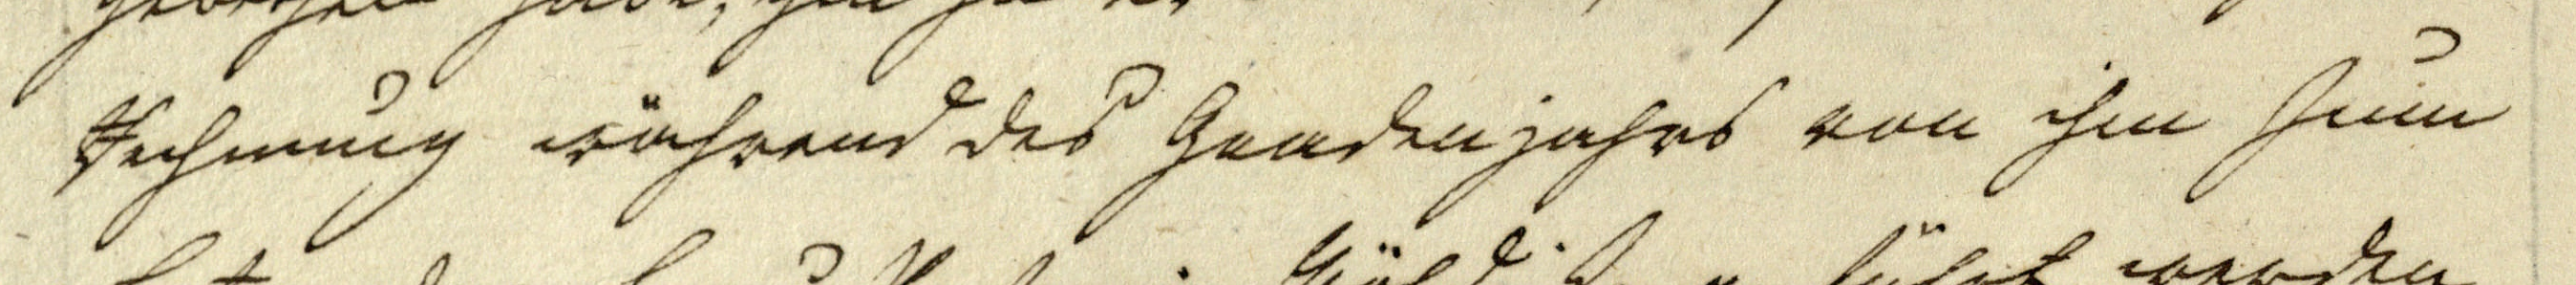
Rechnung während des Gnadenjahrs von ihm zum
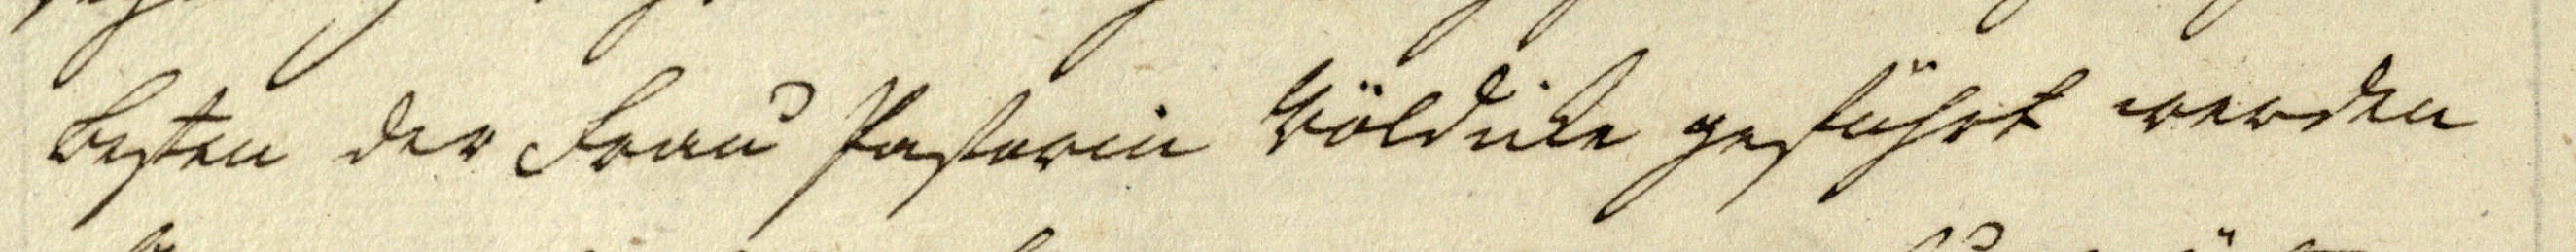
besten der Frau Pastorin Wöldicke geführt werden
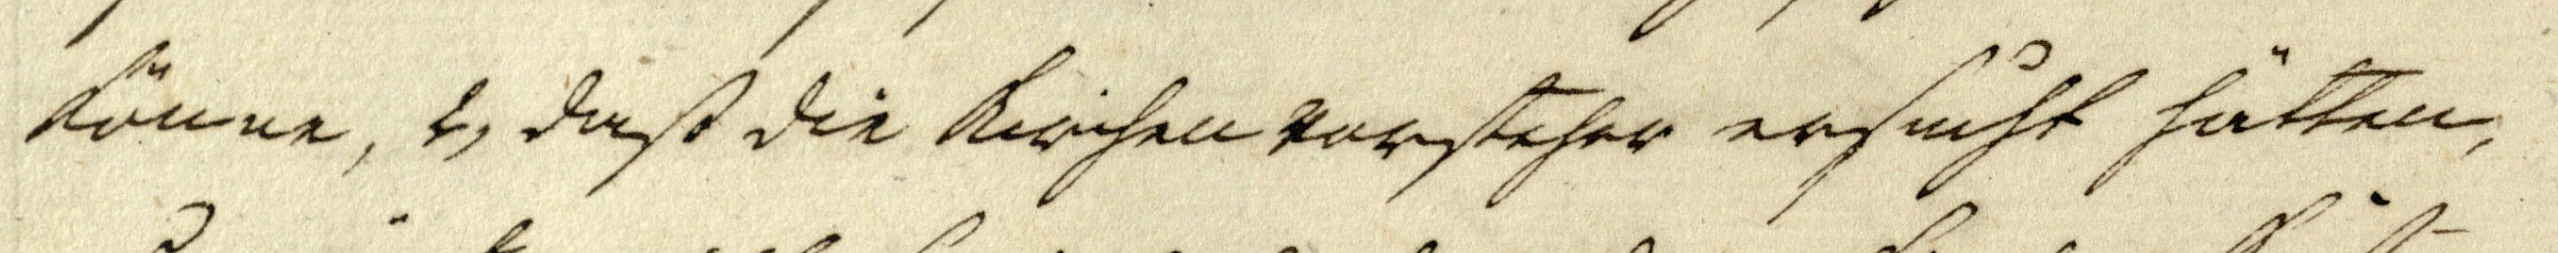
könne, 2, daß die Kirchenvorsteher ersucht hätten,
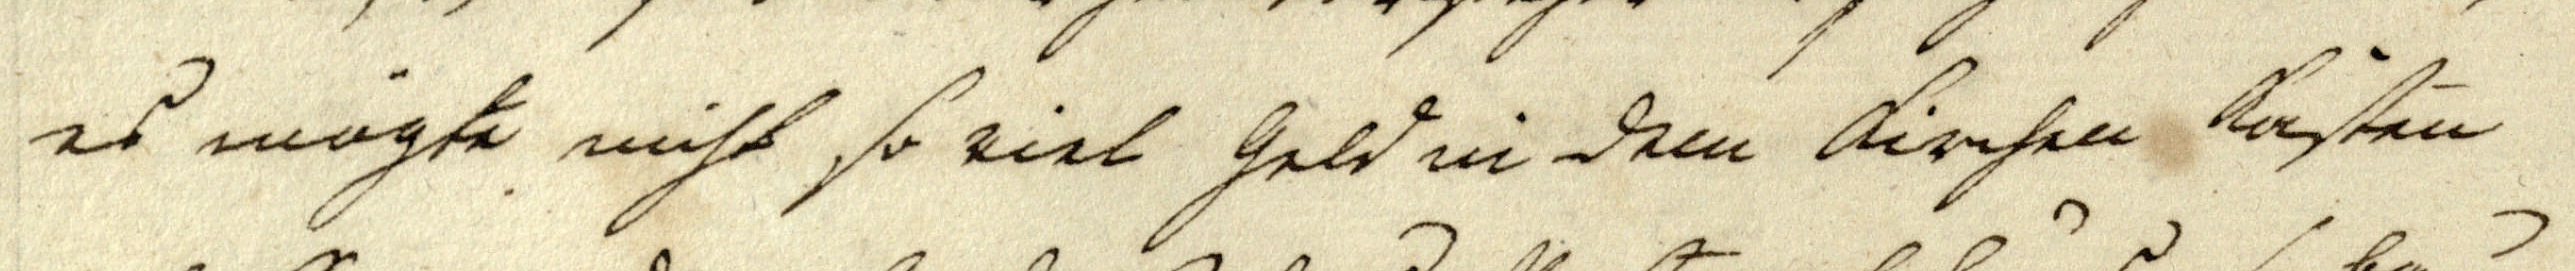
es mögte nicht so viel Geld in dem Kirchen Kasten
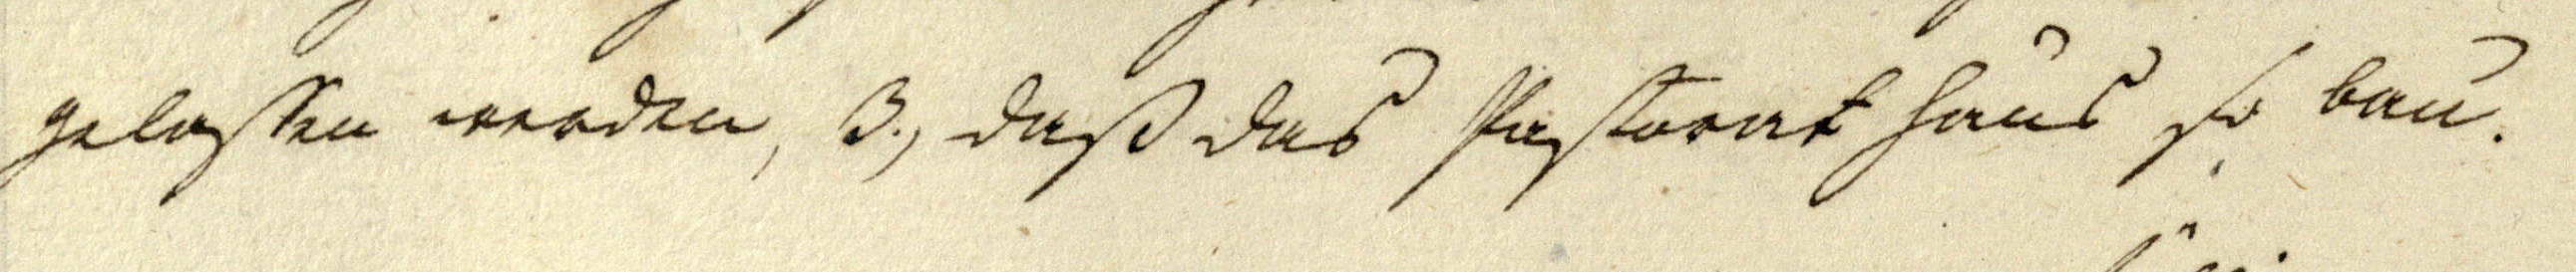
gelassen werden, 3., daß das Pastorathaus so bau¬
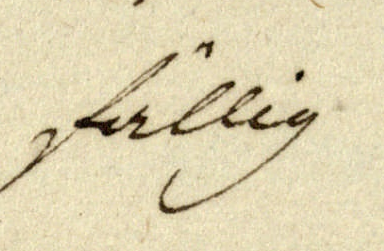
fällig
